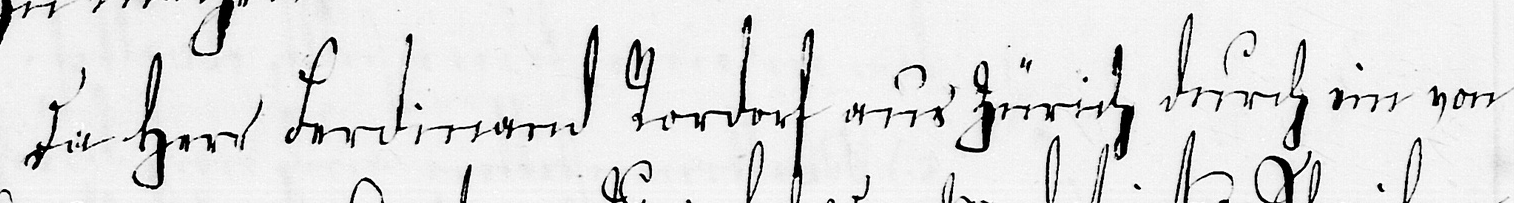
Da Herr Ferdinand Rordorf aus Zürich durch ein von
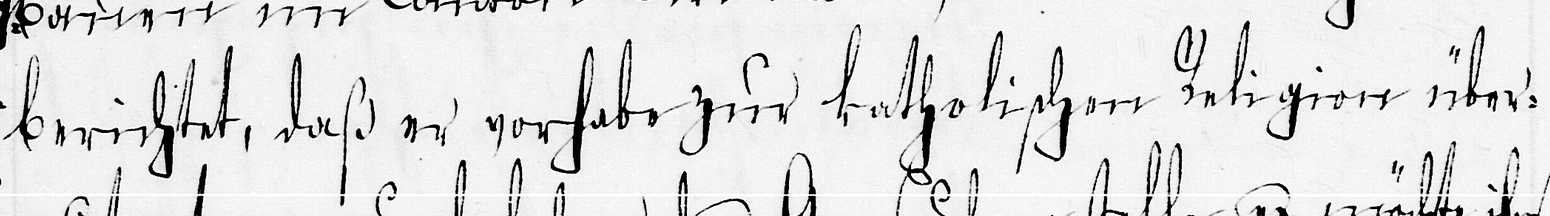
berichtet, daß er vorhabe zur katholischen Religion über¬
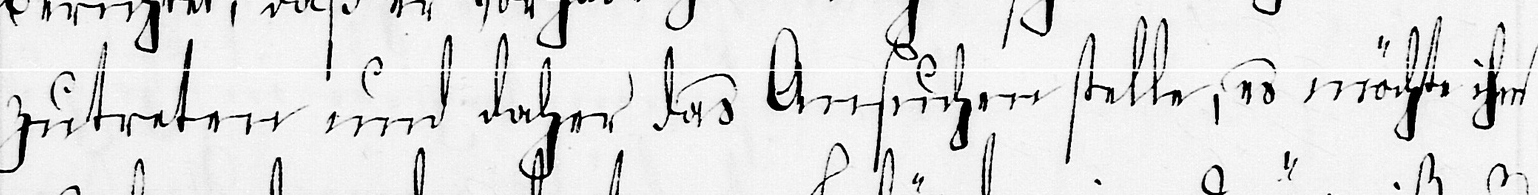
zutreten und daher das Ansuchen stelle, es möchte ihm
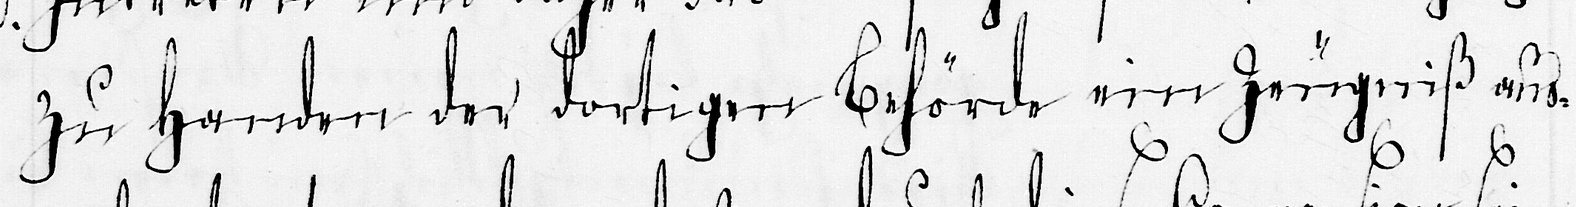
zu Handen der dortigen Behörde ein Zeugniß aus¬
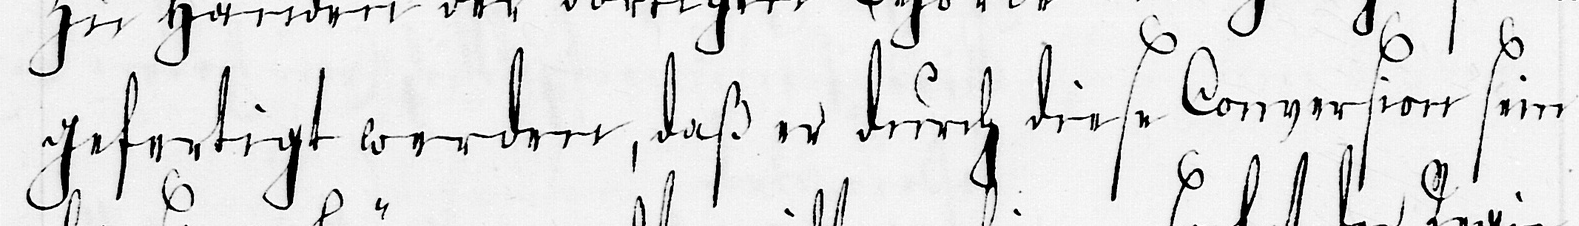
gefertigt werden, daß er durch diese Conversion sein
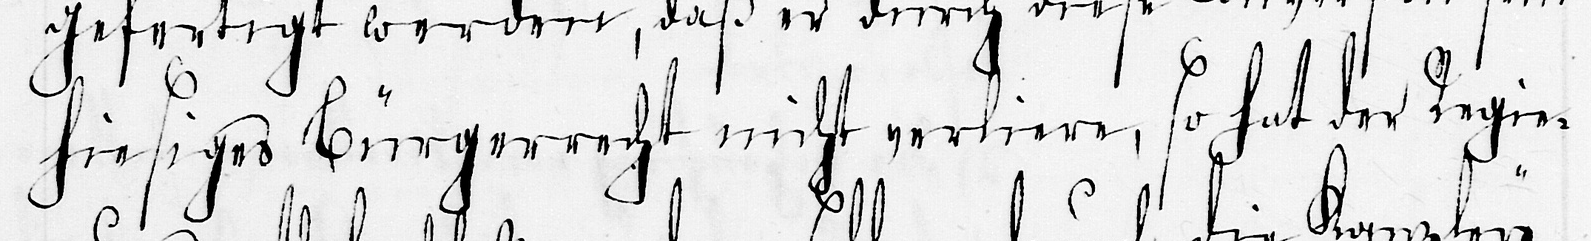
hiesiges Bürgerrecht nicht verliere, so hat der Regie¬
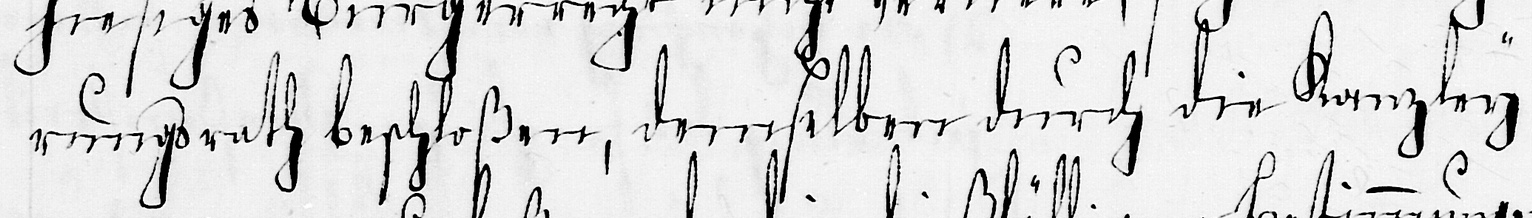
rungsrath beschloßen, demselben durch die Kanzley
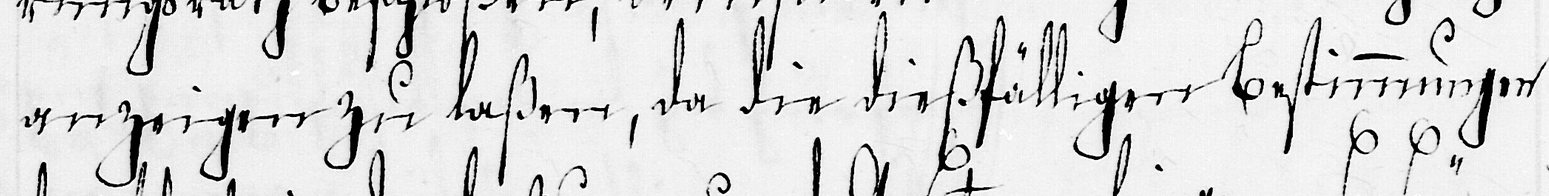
anzeigen zu laßen, da die dießfälligen Bestimmungen
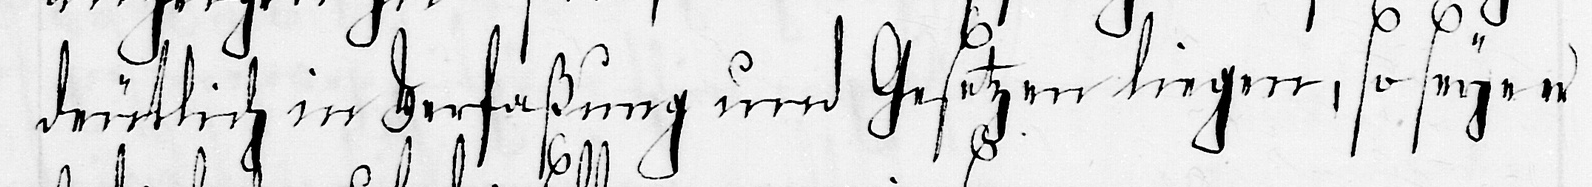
deutlich in Verfaßung und Gesetzen liegen, so seye er
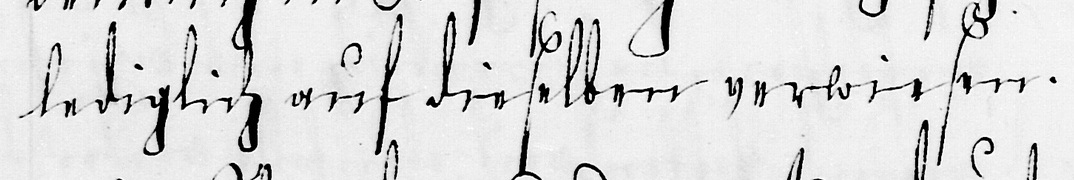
lediglich auf dieselben verwiesen.
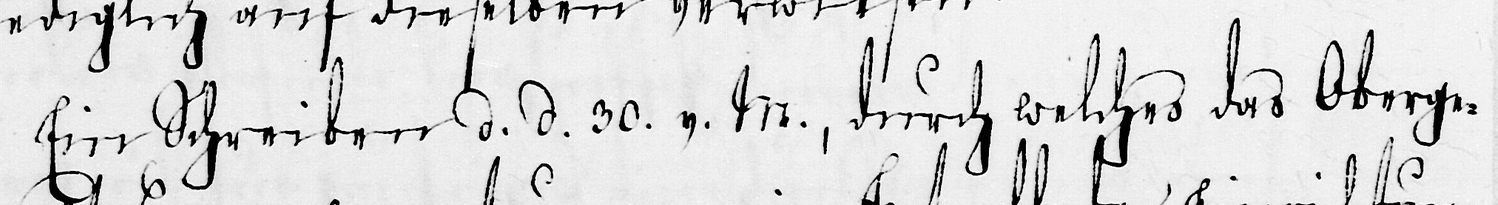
Ein Schreiben d. d. 30. v. M., durch welches das Oberge¬
